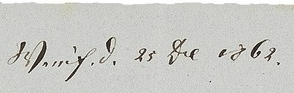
Weinf. d. 25 Dec 1862
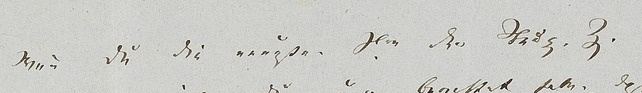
Wenn Du die neuesten Nrn der Thurg. Z.
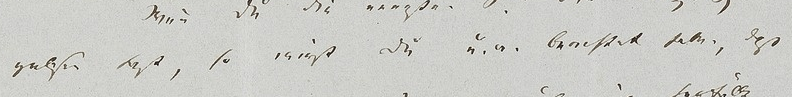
gelesen hast, so wirst Du u. a. beachtet haben, daß
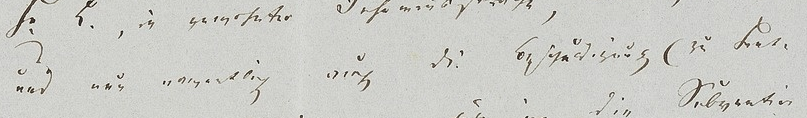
und nun namentlich auch die Beschuldigung (zu Leuten
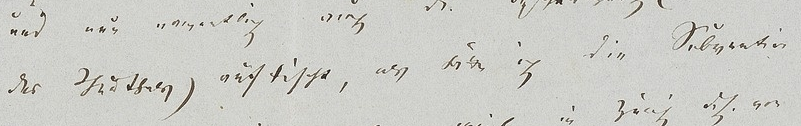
des Thurthals) auftischt, als hätte ich die Subvention
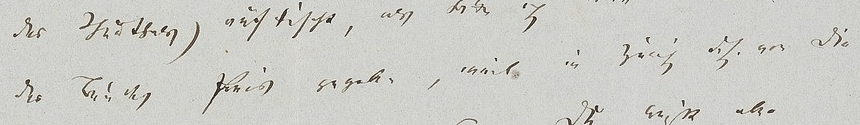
des Bundes Preis gegeben, weil in Zürich d. h. von Dir
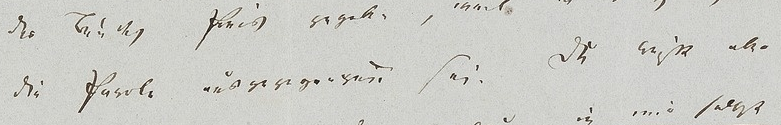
die Parole ausgegegangen sei. Du weißt aber
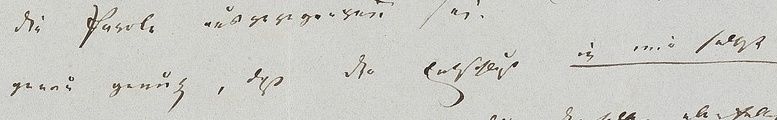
genau genug, daß der Entschluß in mir selbst
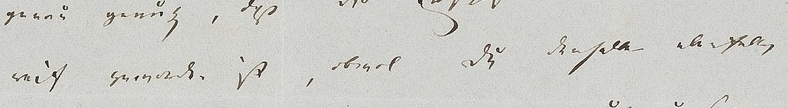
reif geworden ist, obwol Du denselben ebenfalls
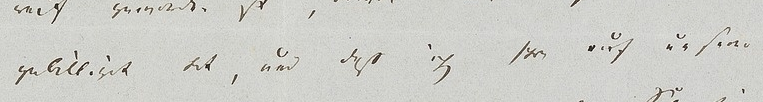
gebilliget hat, und daß ich schon auf unserer
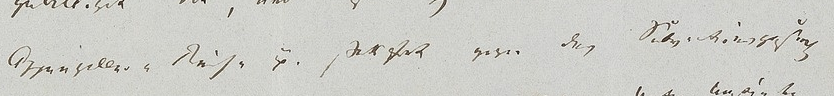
Appenzeller-Reise &. stetsfort gegen das Subventionsgesuch
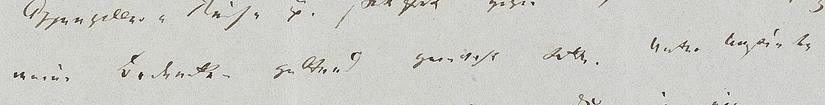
meine Bedencken geltend gemacht hatte. Unter Umständen
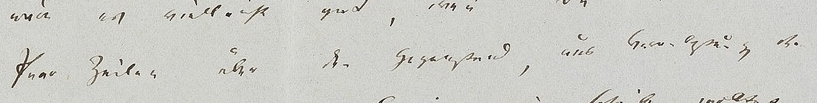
Paar Zeilen über den Gegenstand, aus Veranlaßung der
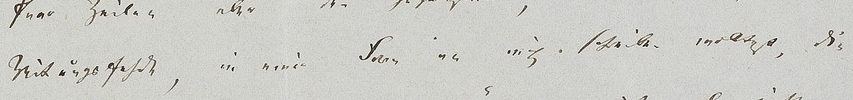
Zeitungsfehde, in einer Form an mich schreiben wolltest, die
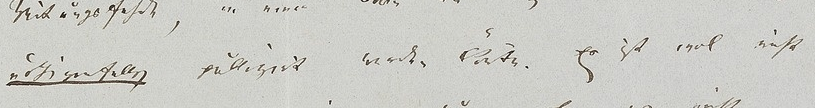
nöthigenfalls publizirt werden könnte. Es ist wol nicht
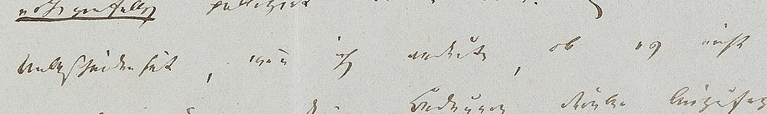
Unbescheidenheit, wenn ich andeute, ob es nicht
